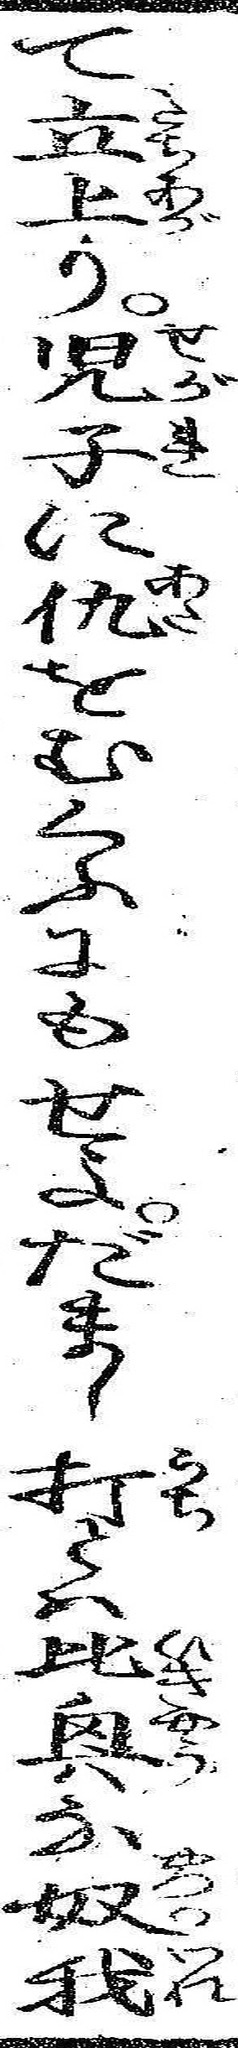て立上り。児子に仇をむくふにもせよ。だまし打とは比興な奴。我
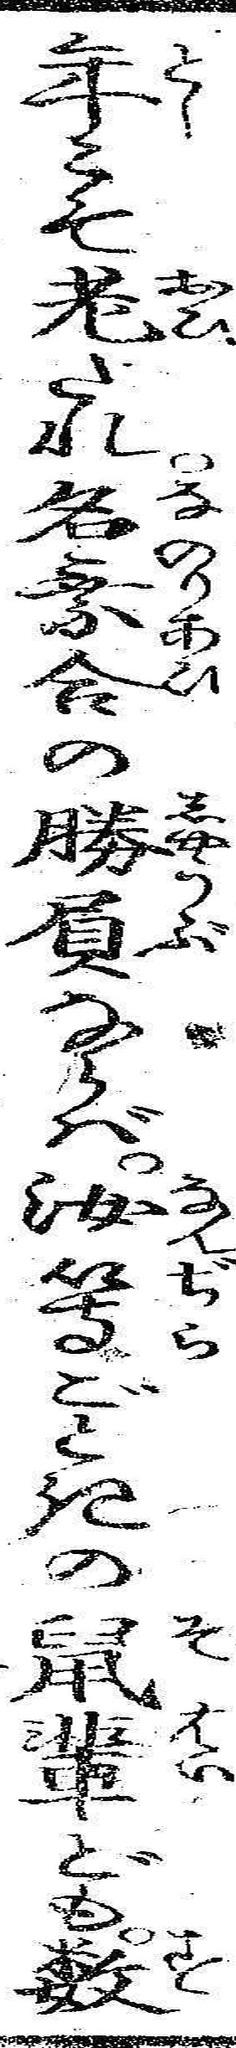年こそ老たれ。名乗合の勝負ならば。汝等ごときの鼠輩ども。数
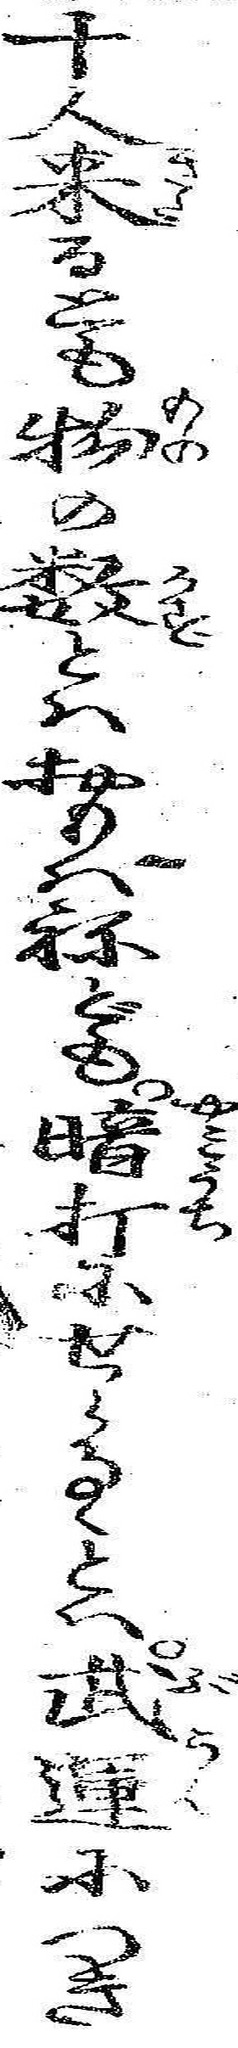十人来るとも物の数とはおもはねども。暗打にせらるゝとは。武運につき
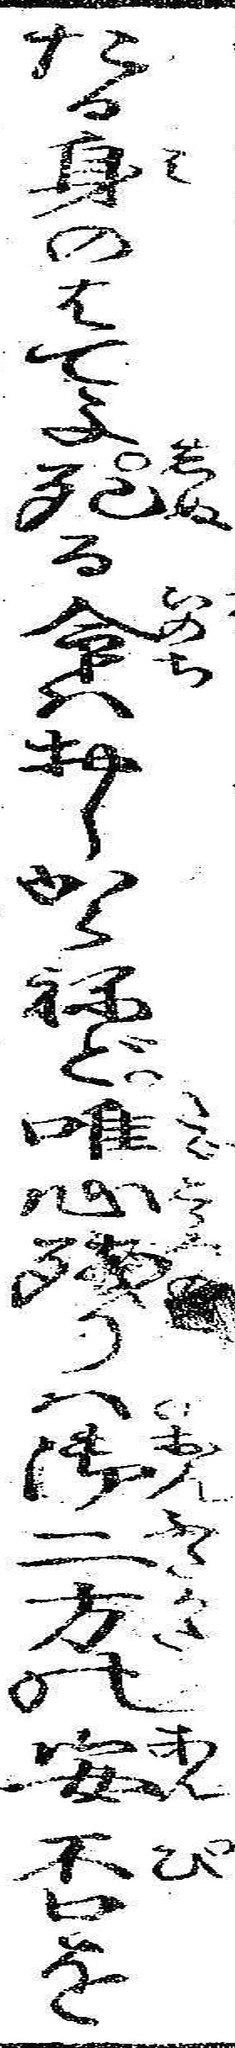たる身のはてよ。死る命はおしからねど。唯心残りは。御二方の安否を
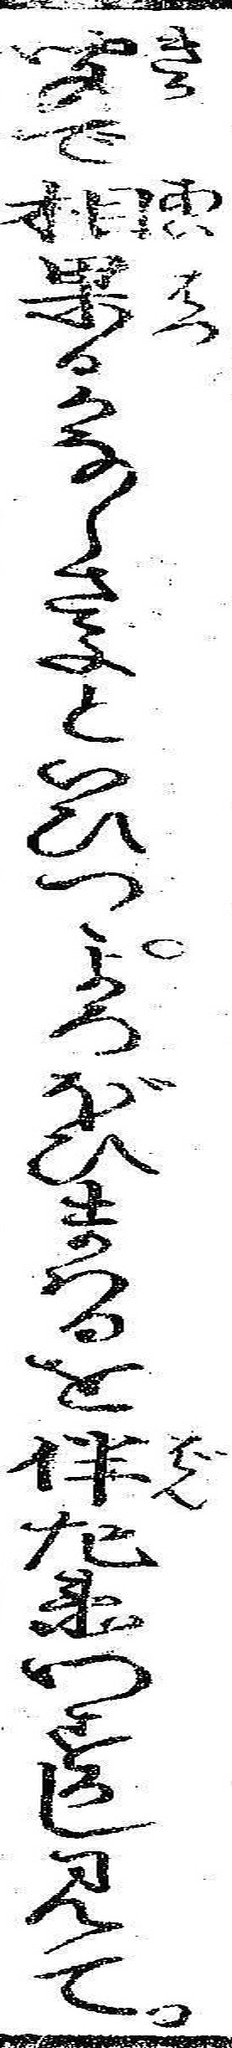聞で相果るかなしさよといひつゝ。よろぼひまわるを伴左衛門すかし見て。
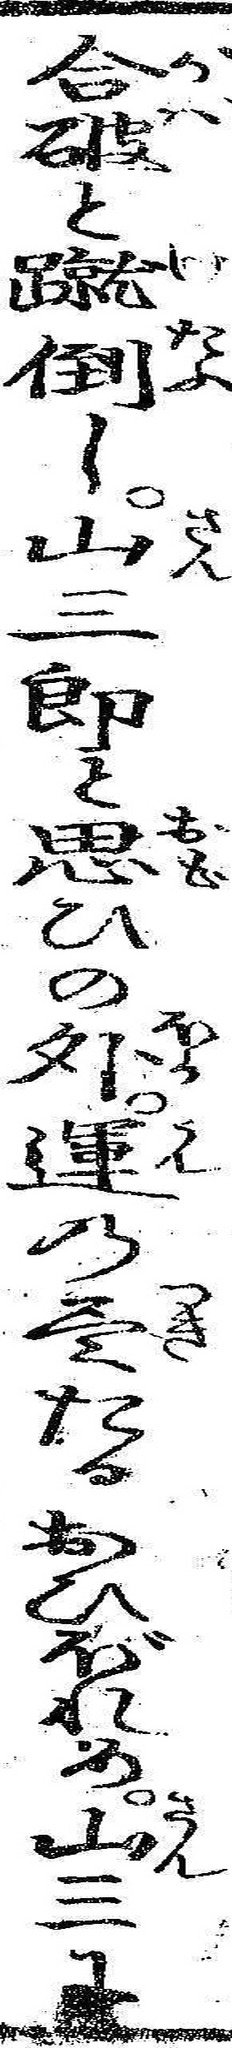合破と蹴倒し。山三郎と思ひの外。運の尽たるおひぼれめ。山三に
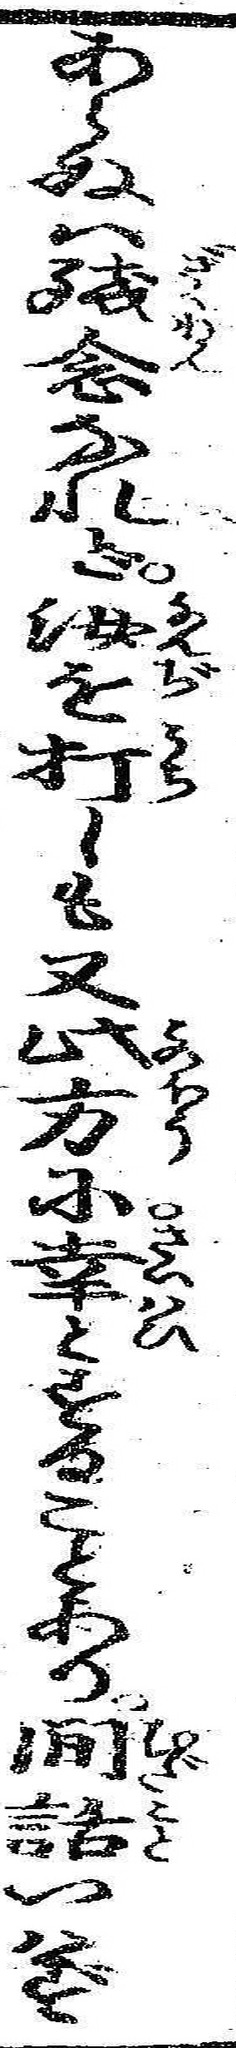あらぬは残念なれど。汝を打しも又此方に。幸とすることあり。間話いはず
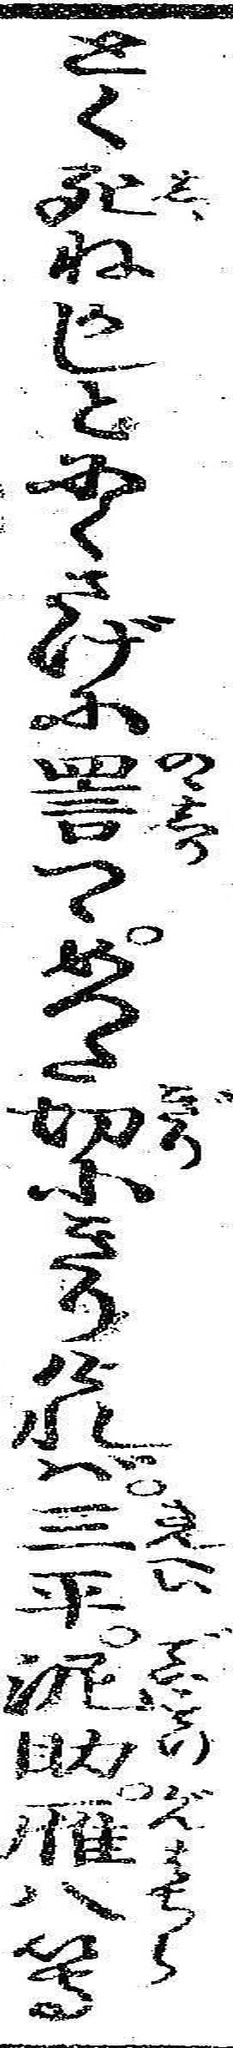とく死ねかしとにくさげに罵つゝ。めつた切にきりければ。三平。泥助。雁八等
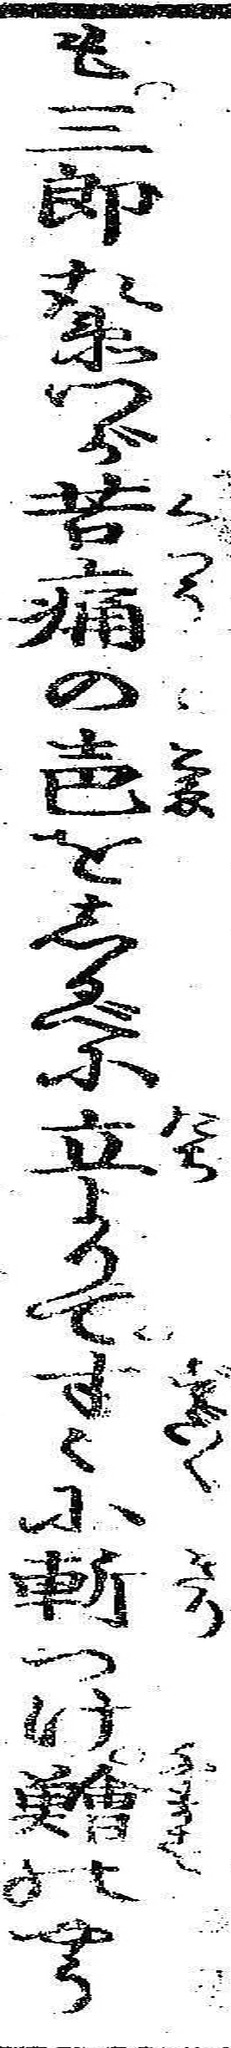も。三郎左衛門が苦痛の声をしるべに立よりて。寸々に斬つけ。鱠のやう
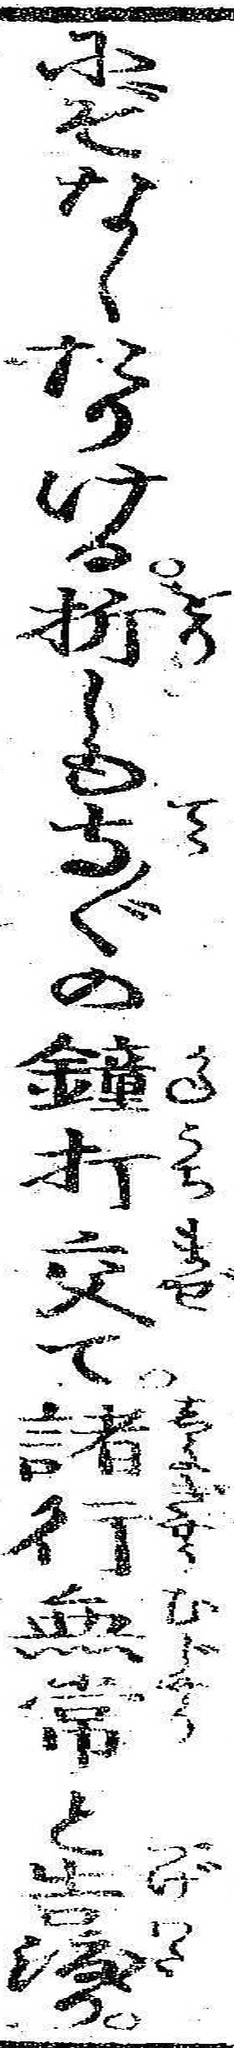にぞなしたりける。折しも寺〴〵の鐘打交て。諸行無常と告渡り。
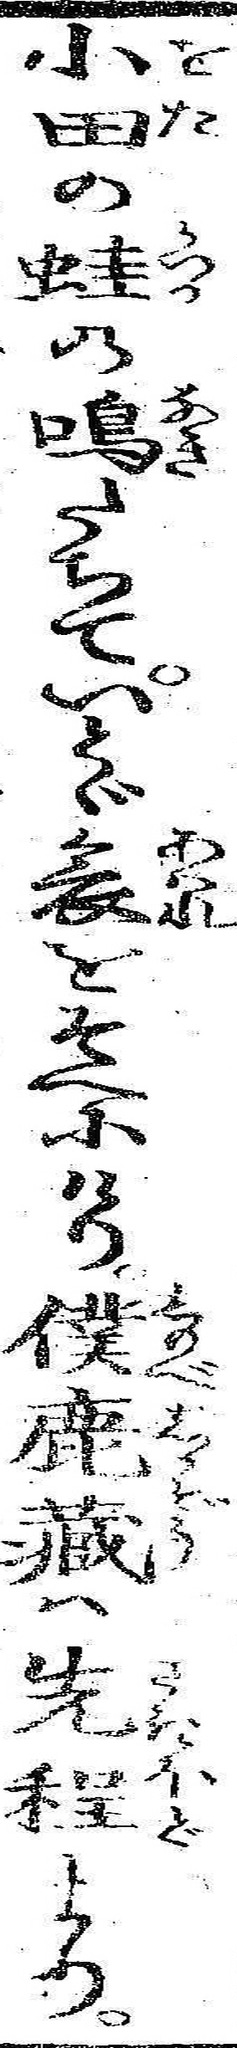小田の蛙の鳴たちて。いとゞ哀をそへにけり。僕鹿蔵は先程より。
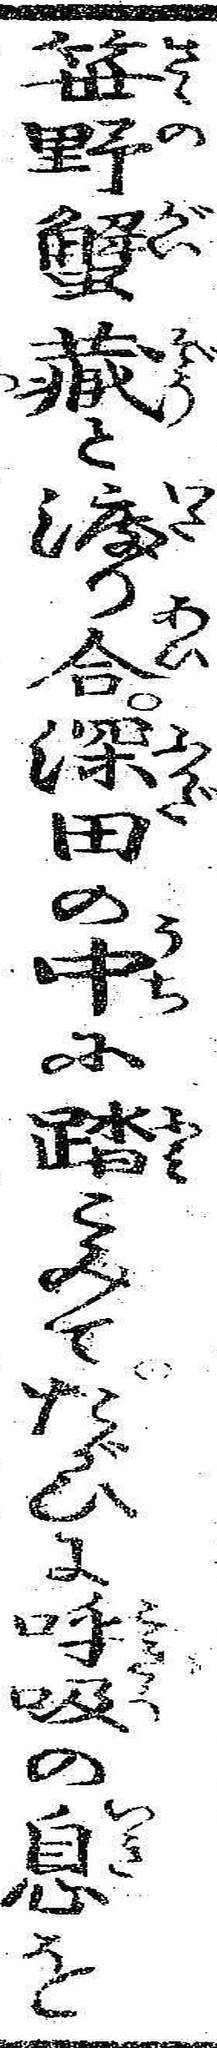笹野蟹蔵と渡り合。深田の中に踏こみて。たがひに呼吸の息を
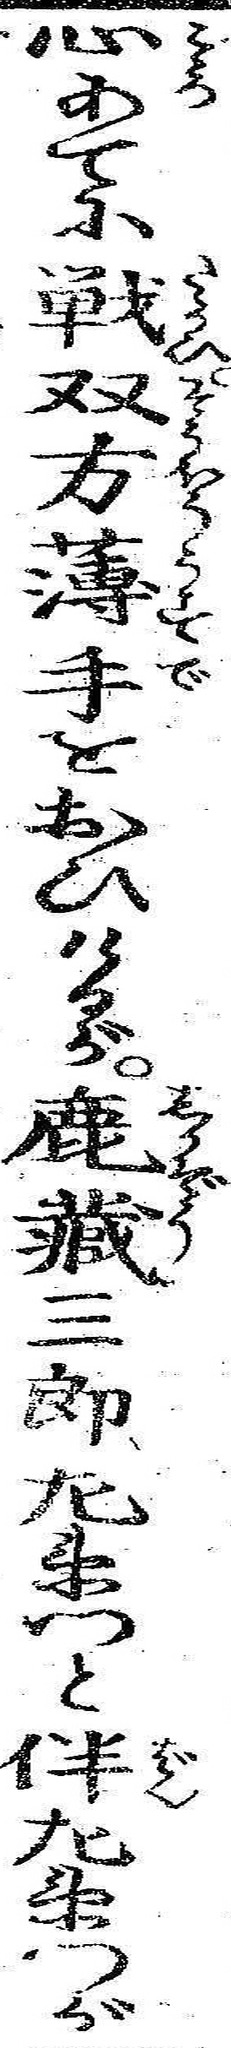心あてに戦。双方薄手をおひけるが。鹿蔵三郎左衛門と伴左衛門が
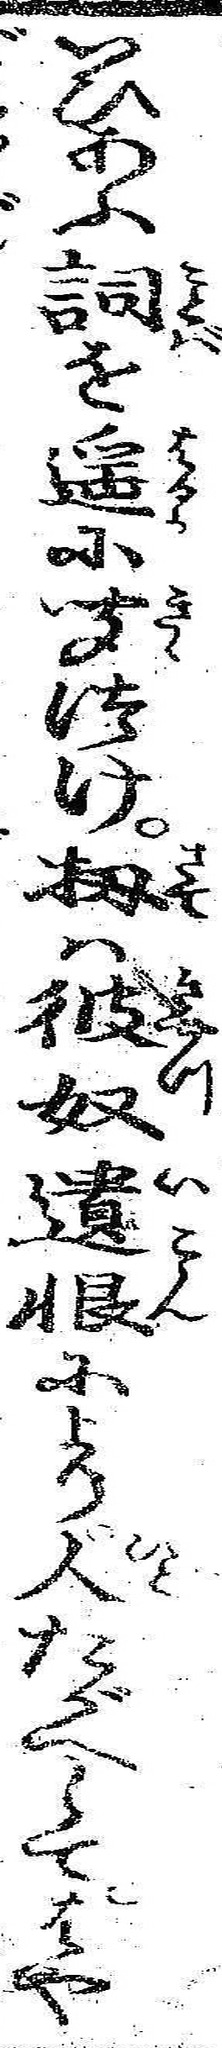いひあふ詞を遥に聞つけ。扨は彼奴遺恨により。人たがへして。はや
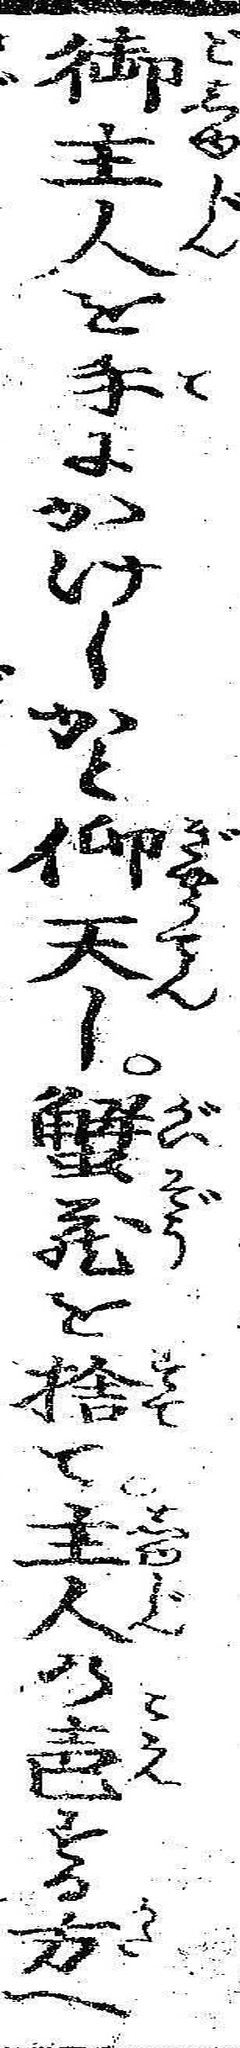御主人を手にかけしかと仰天し。蟹蔵を捨て。主人の声する方へ
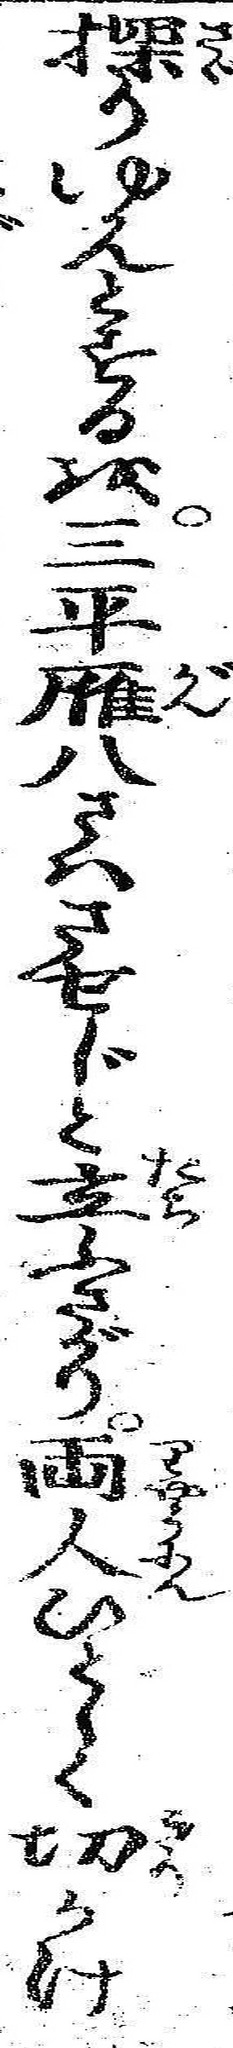探りゆかんとするを。三平雁八さはさせじと立ふさがり。両人ひとしく切かけ
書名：昔話稲妻表紙
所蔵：国文学研究資料館
